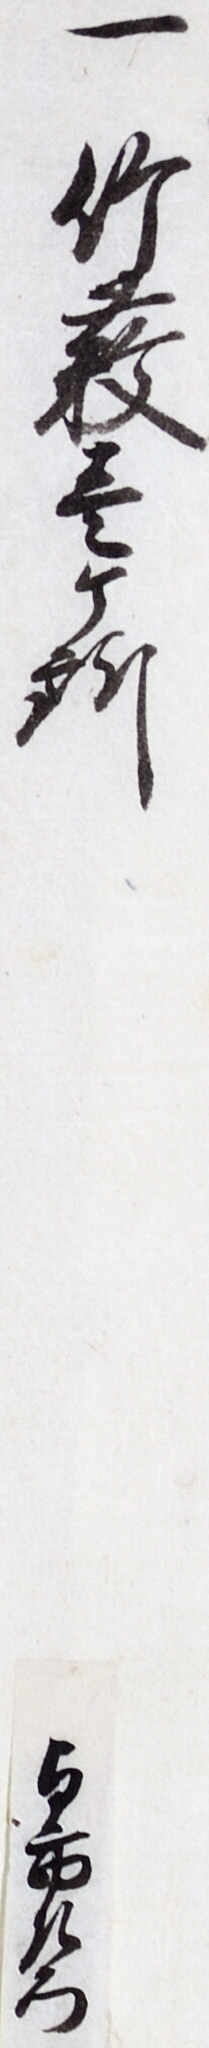一竹薮壱ヶ所与市左衛門
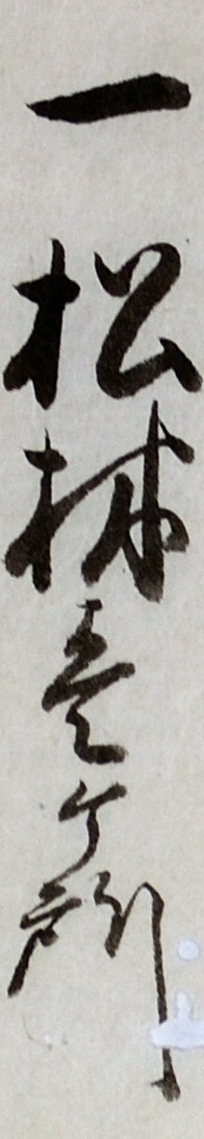一松林壱ヶ所

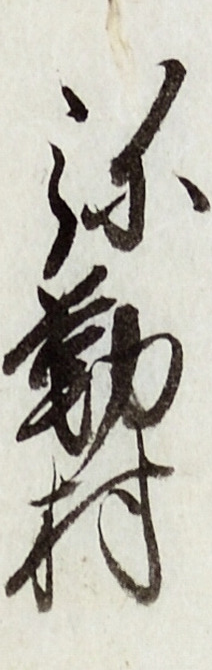弥勒村
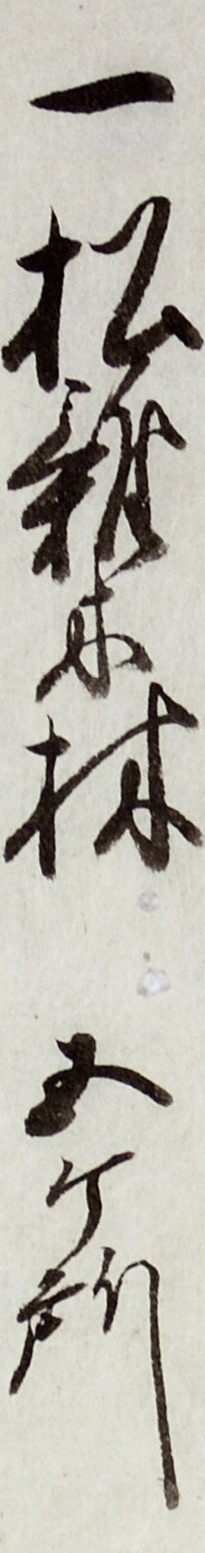一松雑木林五ヶ所
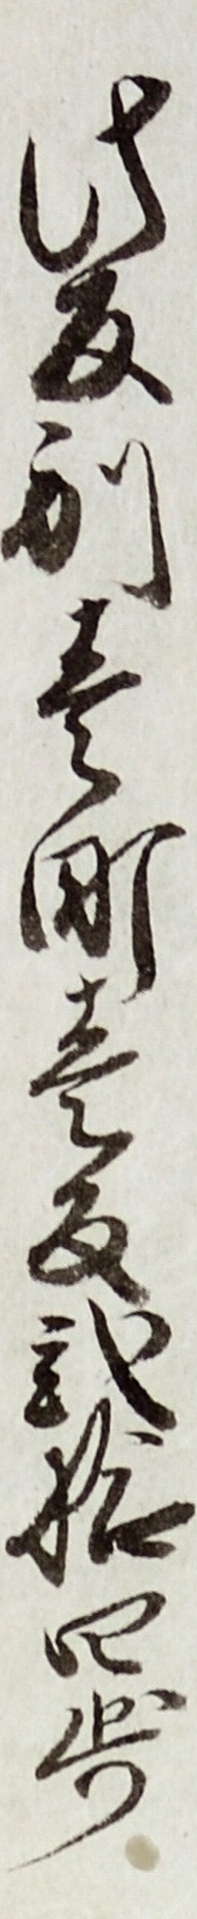此反別壱町壱反弐拾四歩
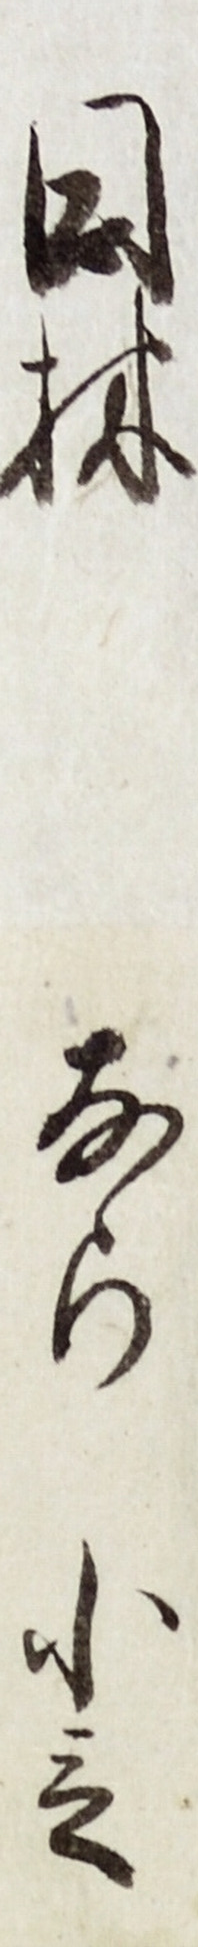同林なら小立
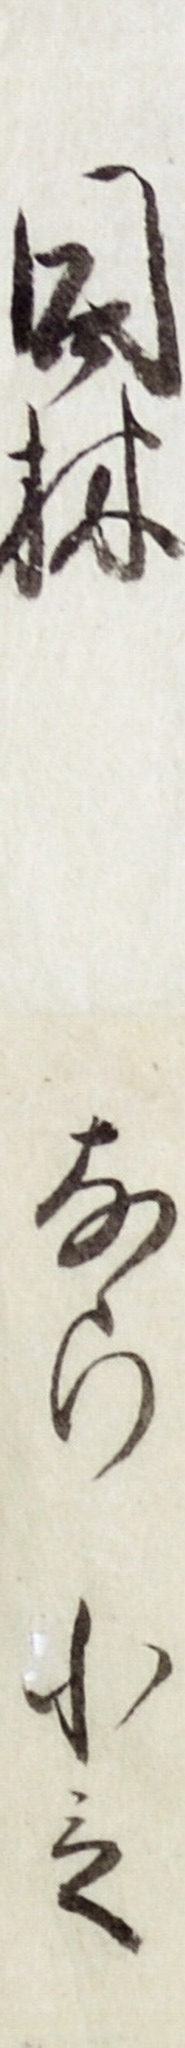同林なら小立
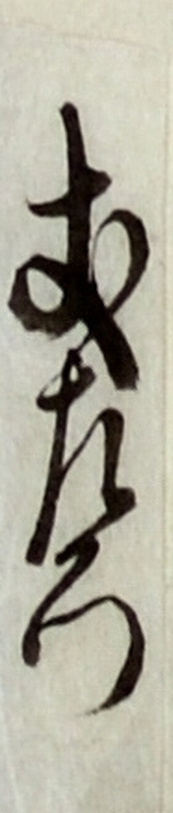丈左衛門

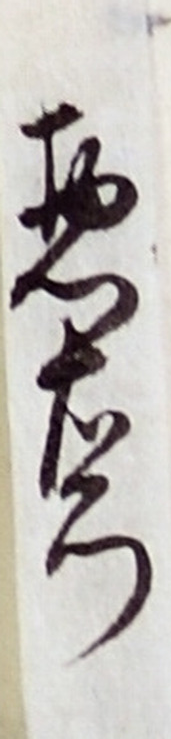甚右衛門
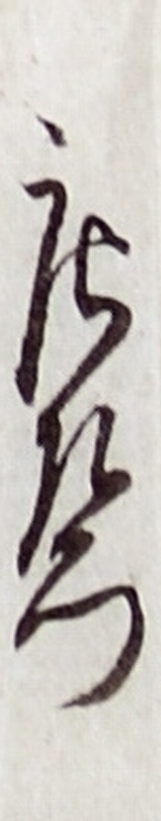杢左衛門
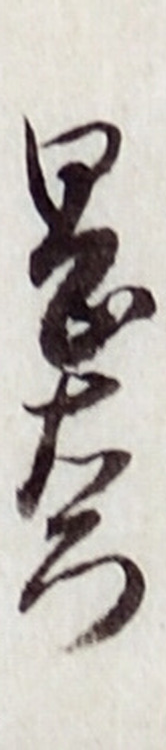甚右衛門
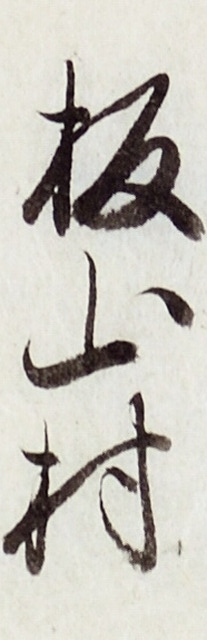板山村
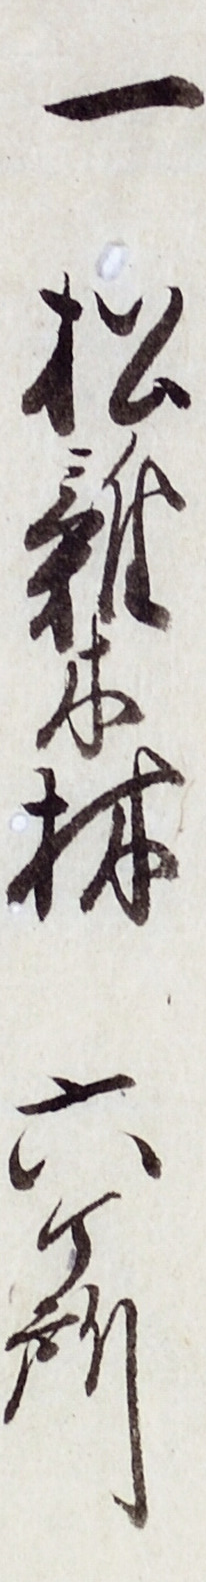一松雑木林六ケ所
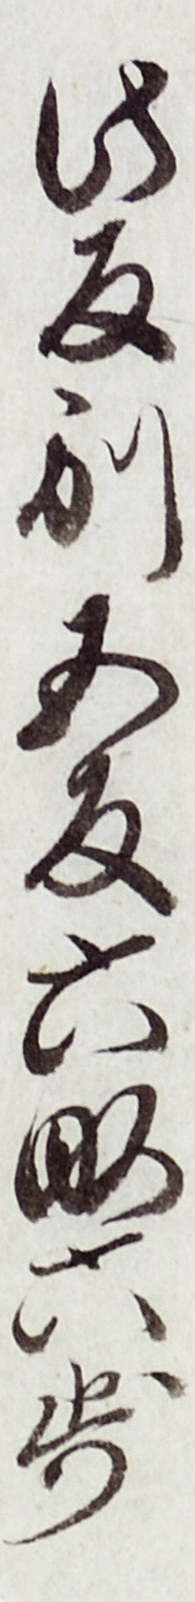此反別五反六畝六歩
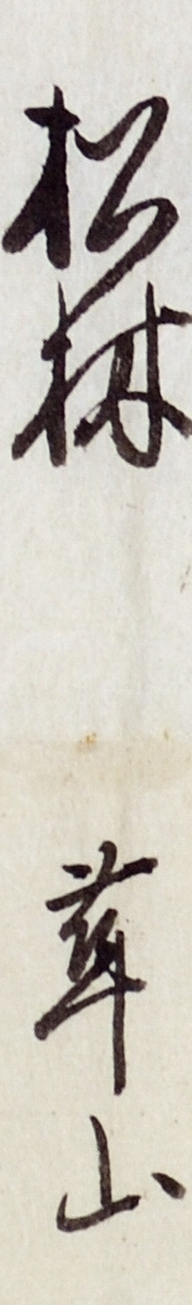松林茸山
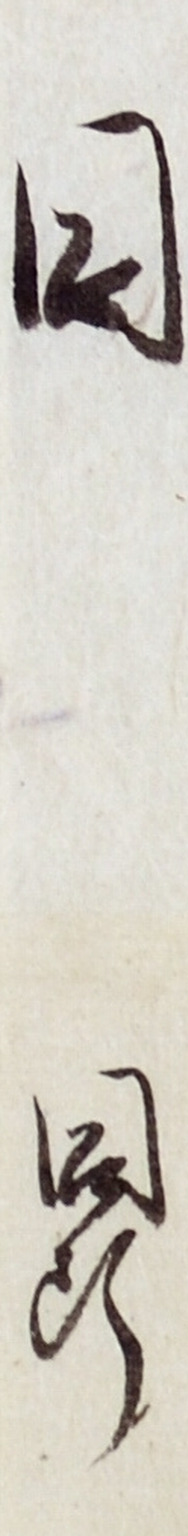同同所
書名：御領分中御林御藪附帳
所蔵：伊那市立高遠町図書館・合同会社AMANE
